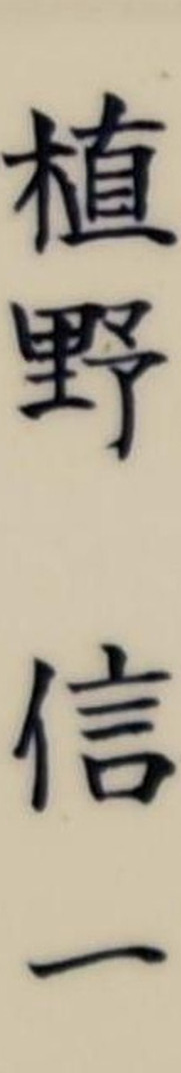埴野信一
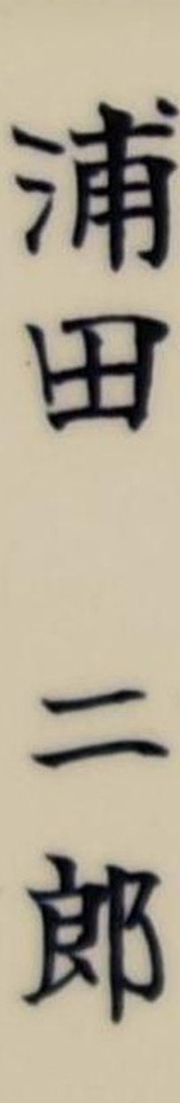浦田二郎
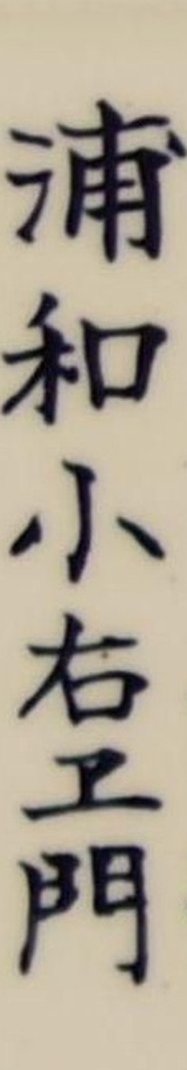浦和小右ヱ門
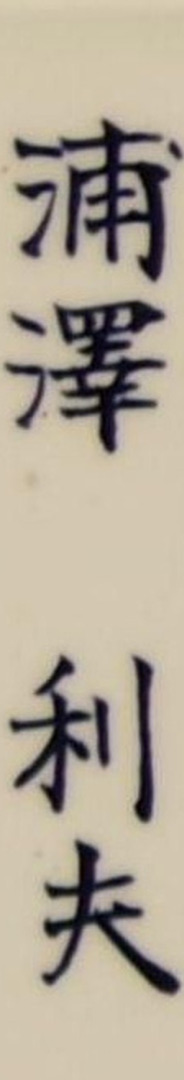浦澤利夫
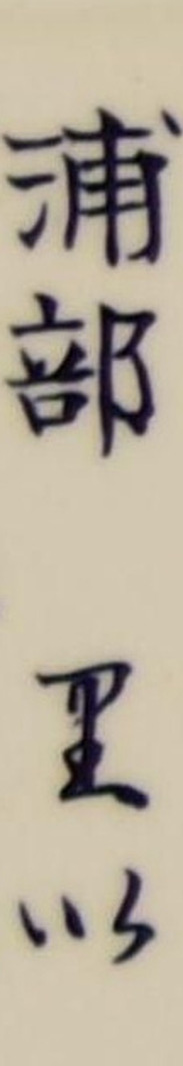浦部里以
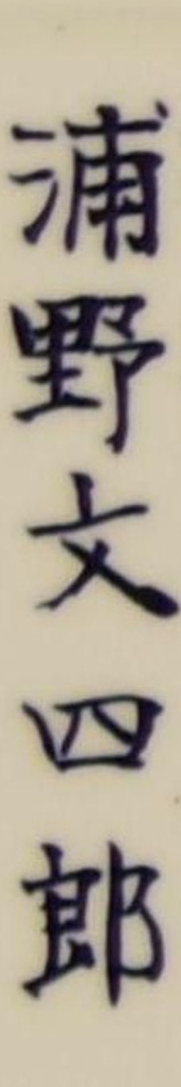浦野文四郎
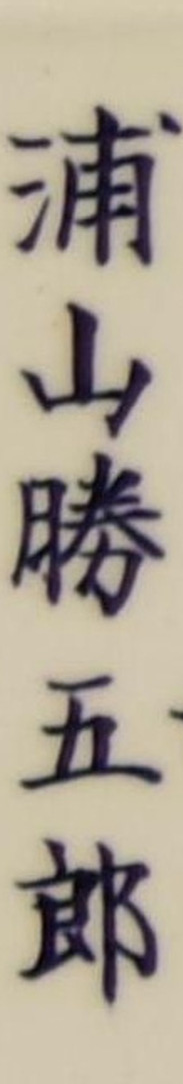浦山勝五郎
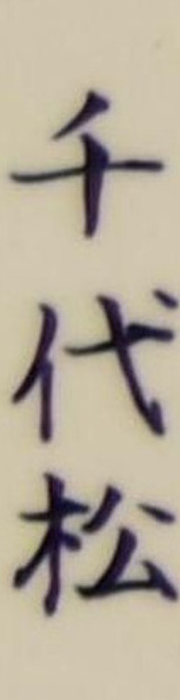千代松

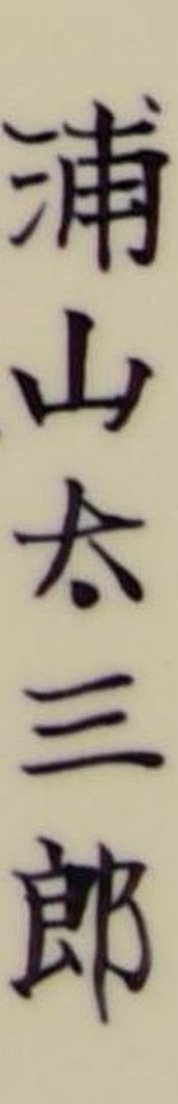浦山太三郎
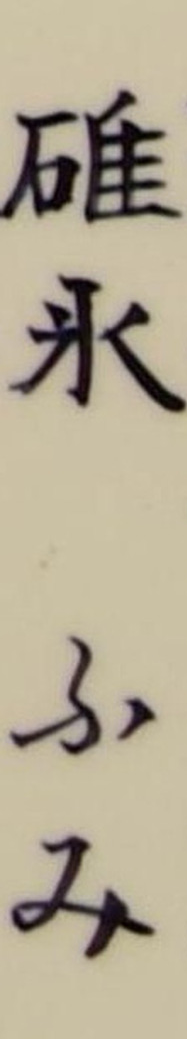碓氷ふみ
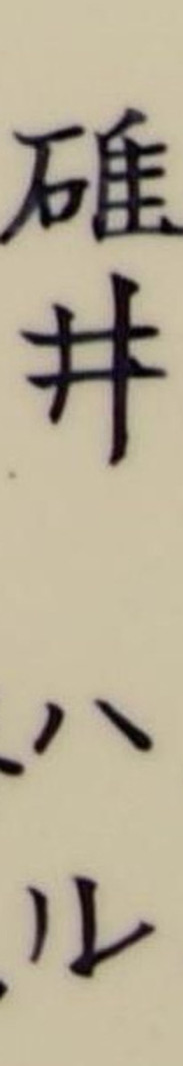碓井ハル
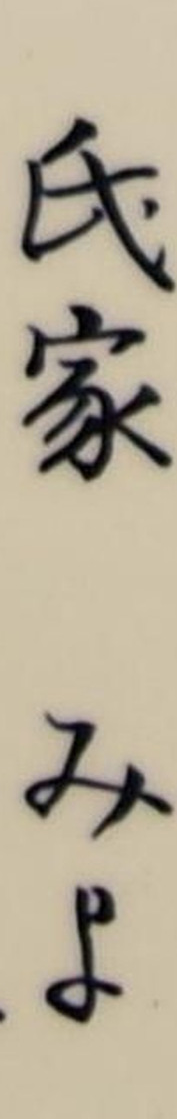氏家みよ
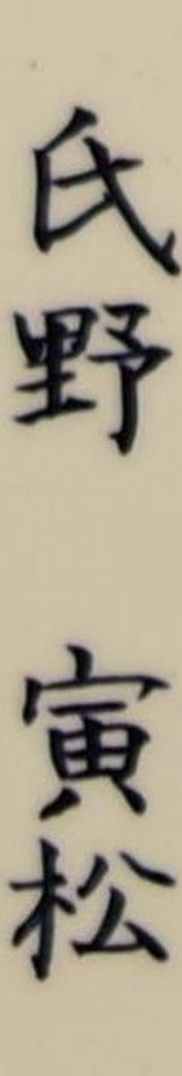氏野寅松
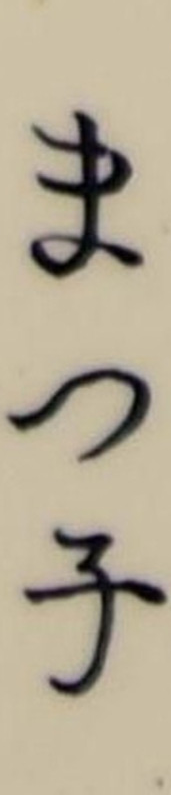まつ子
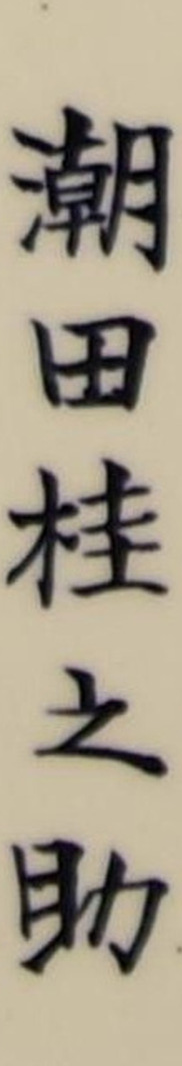潮田桂之助
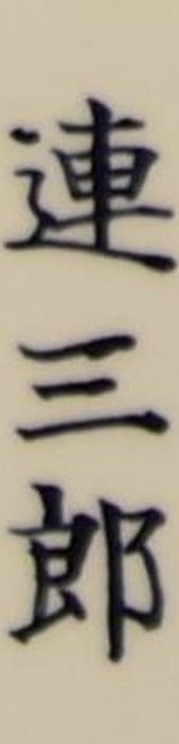連三郎
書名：A~D
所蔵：koyasan kongobuji
